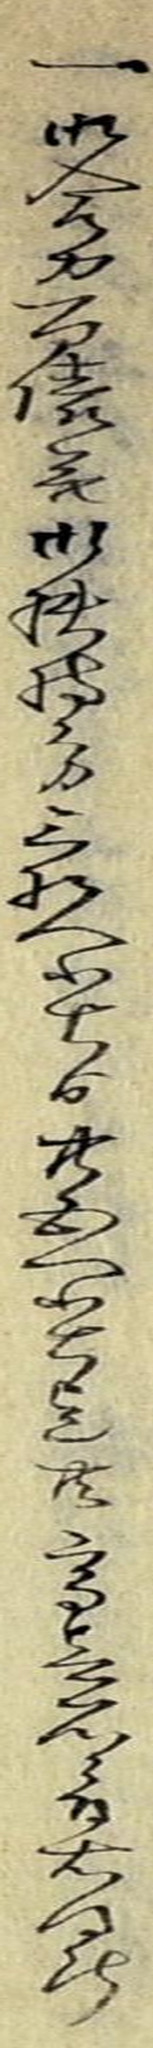一御合力百俵并御扶持方三拾人ふちゟ廿五人ふち迄共高壱石に付右同断
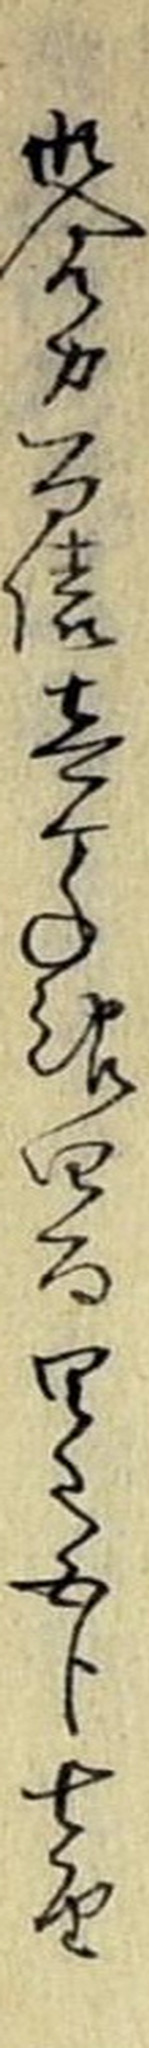御合力百俵壱ヶ年銀四百四匁五分七厘
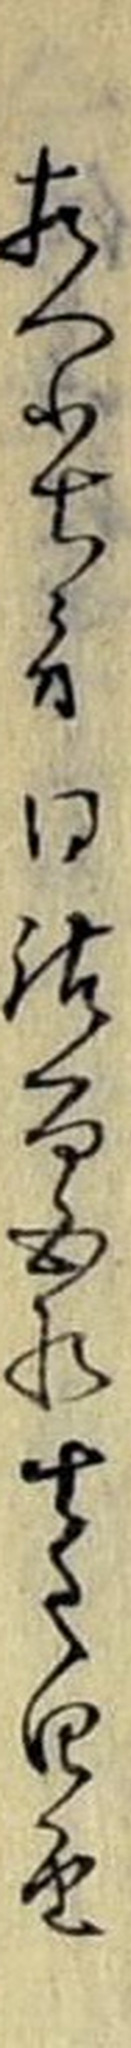拾人ふちに付同銀百五拾七匁四厘
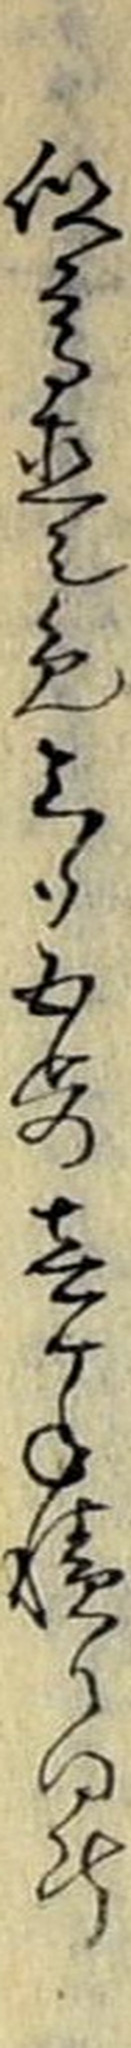但高直し免三ッ五歩壱ヶ年積り同断
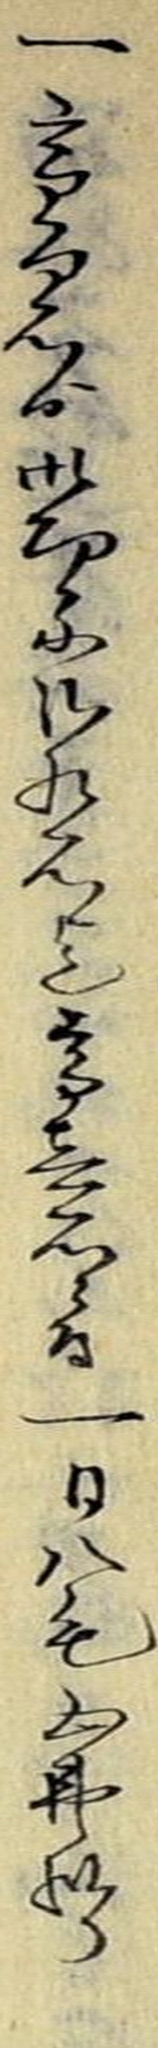一高百石ゟ御切米弐拾石迄高壱石に付一日八毛五弗掛り
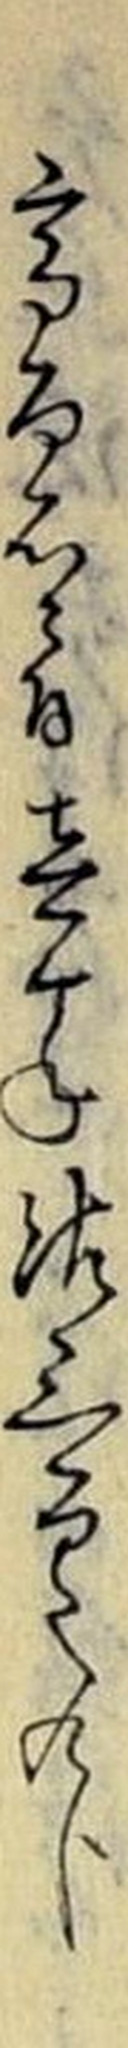高百石に付壱ヶ年銀三百匁九分
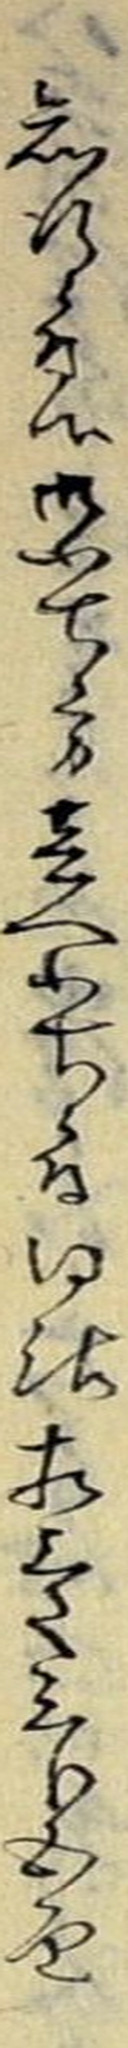知行に付候御ふち方壱人ふちに付同銀拾三匁三分五厘
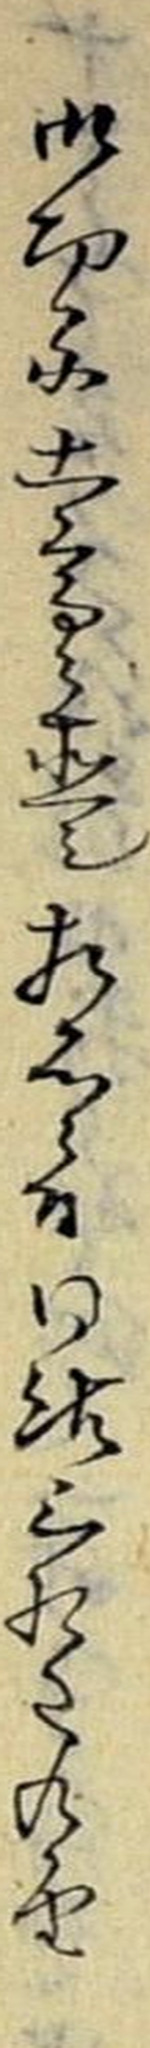御切米出高直し拾石に付同銀三拾匁九厘
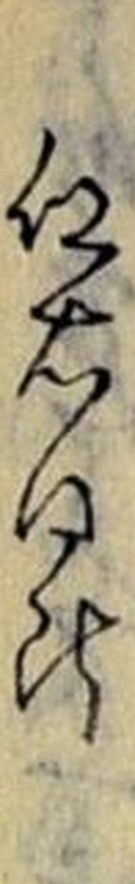但右同断
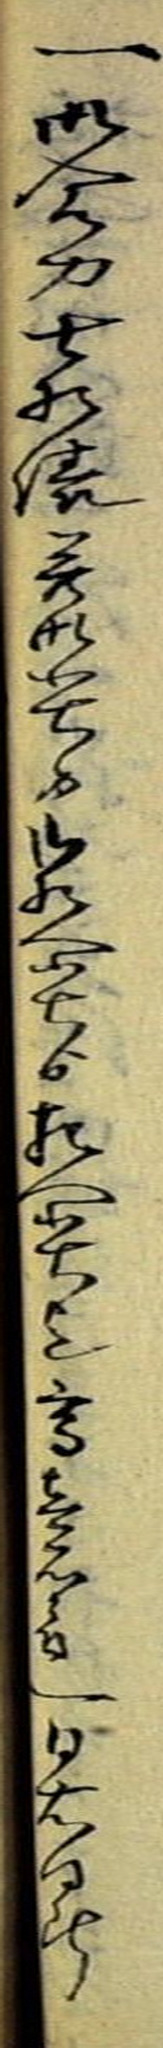一御合力七拾俵并御ふち方弐拾人ふちゟ拾人ふち迄高壱石に付一日右同断
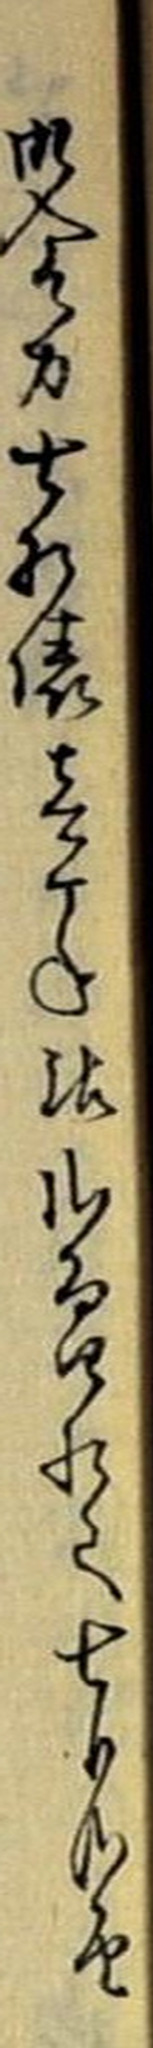御合力七拾俵壱ヶ年銀弐百四拾匁七分弐厘
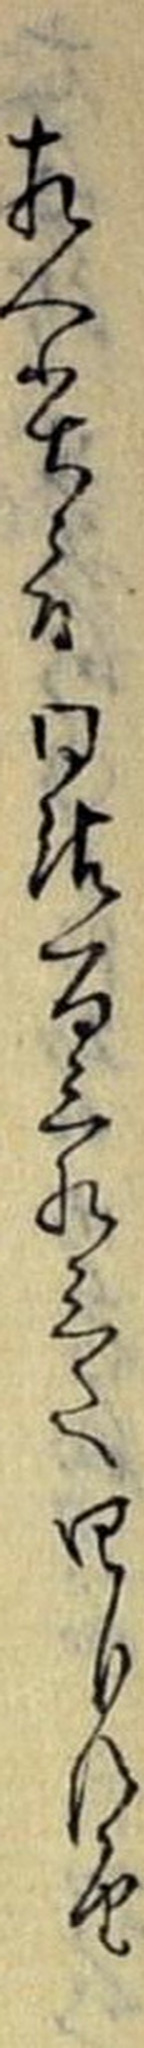拾人扶持に付同銀百三拾三匁四分八厘
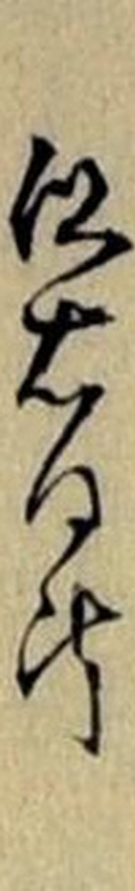但右同断
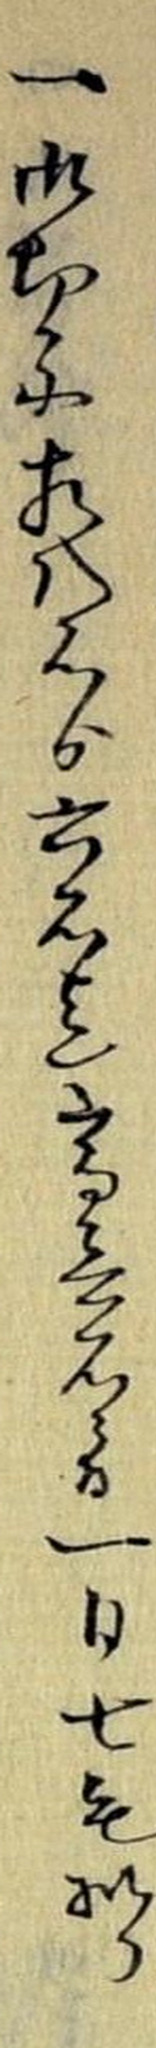一御切米拾八石ゟ六石迄高壱石に付一日七毛掛り
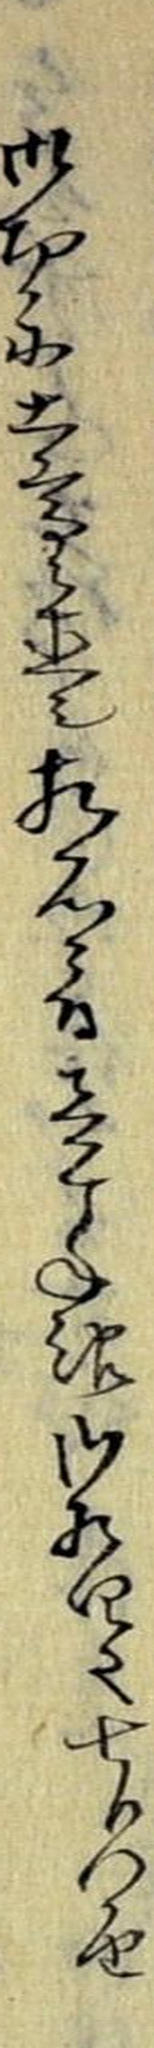御切米出高に直し拾石に付壱ヶ年銀弐拾四匁七分八厘
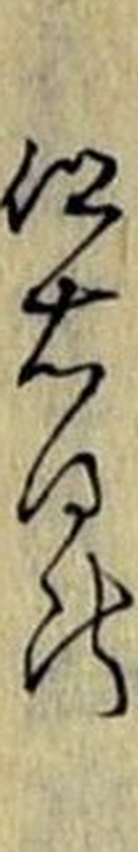但右同断
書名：命令之部 六
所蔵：福井県文書館 Fukui Prefectural Archives
